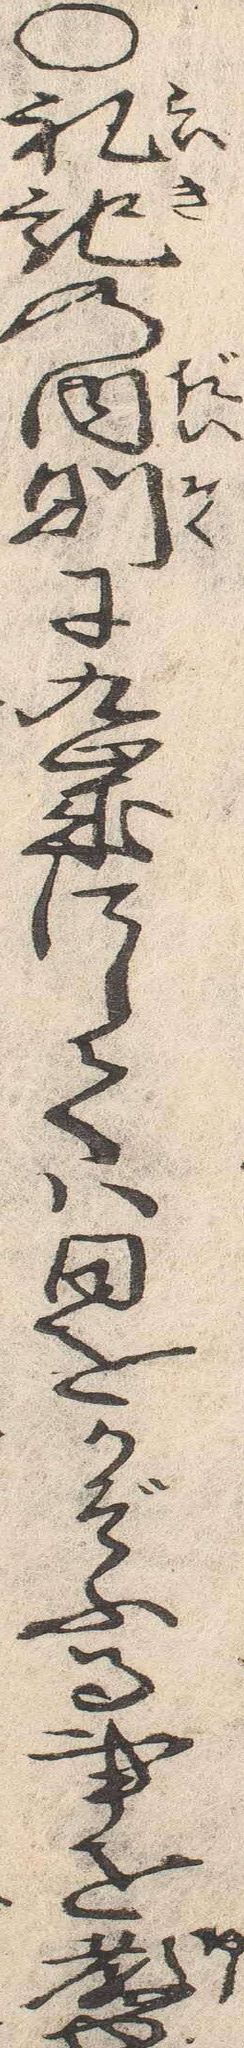○礼記の内則に九歳にしては日をかぞふる事を教ゆ
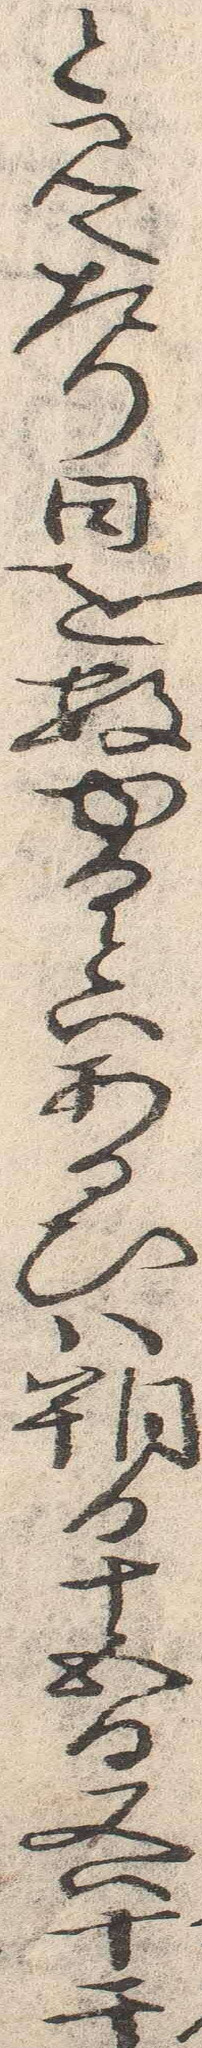と見えたり日を数ゆるとはあるひは朔日十五日又は十干
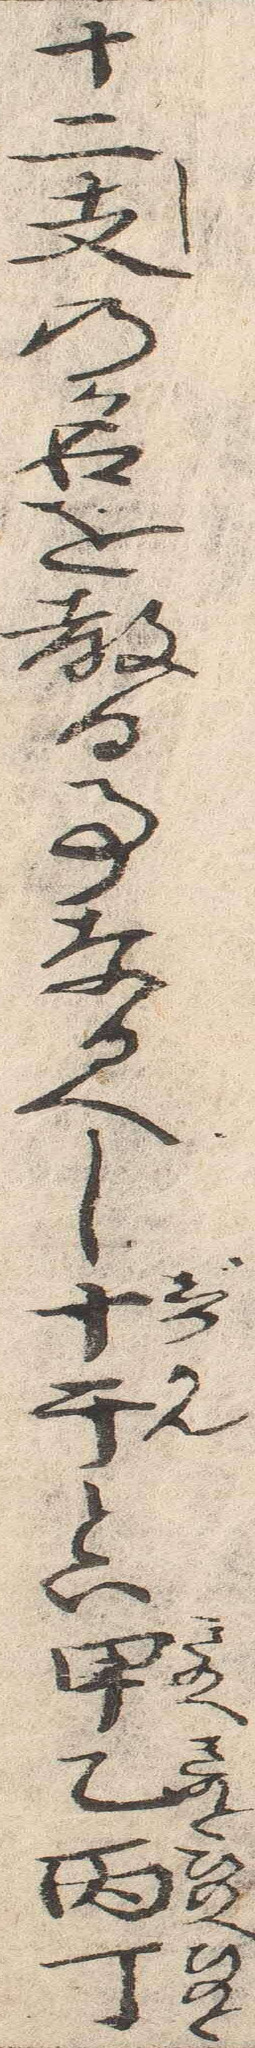十二支の名を教る事なるへし十干とは甲乙丙丁
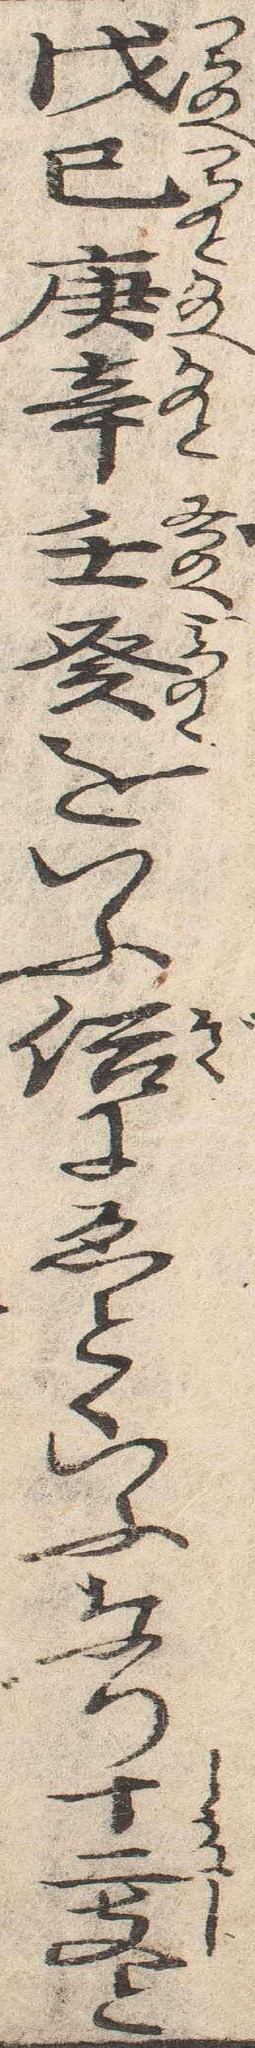戊己庚辛壬癸をいふ俗にゑとゝいふなり十二支と
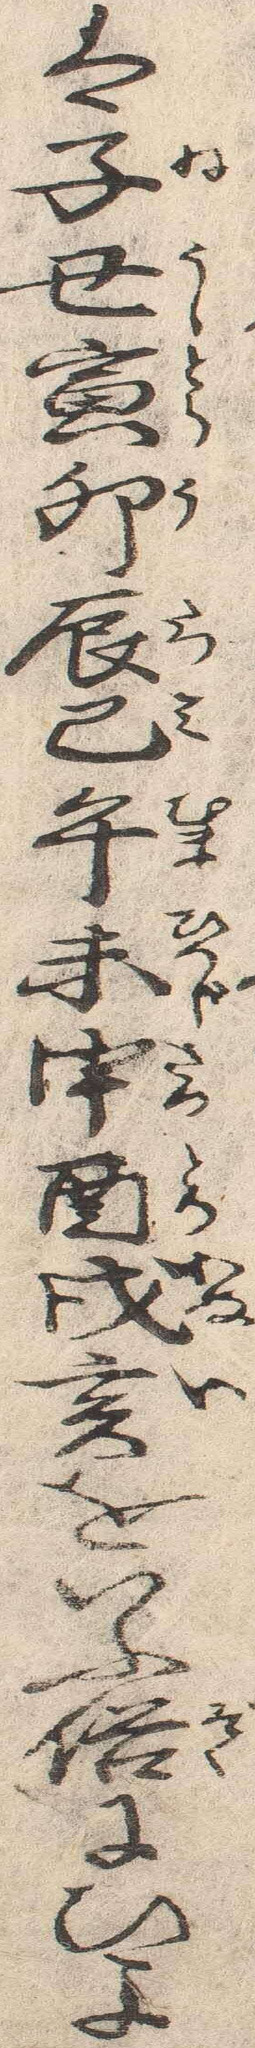は子丑寅卯辰巳午未申酉戌亥をいふ俗にひよ
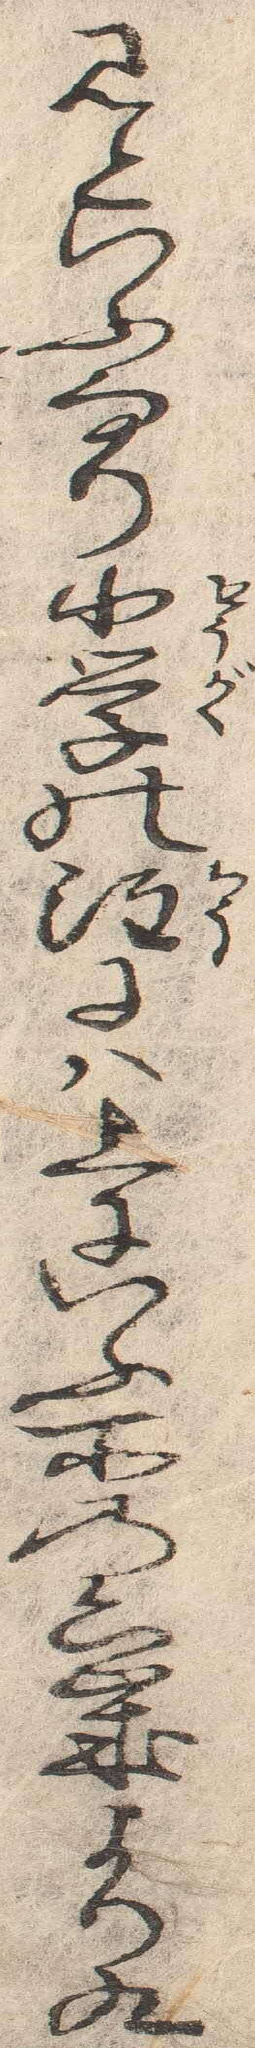みといふなり小学の注には上にいふ所の六歳より九
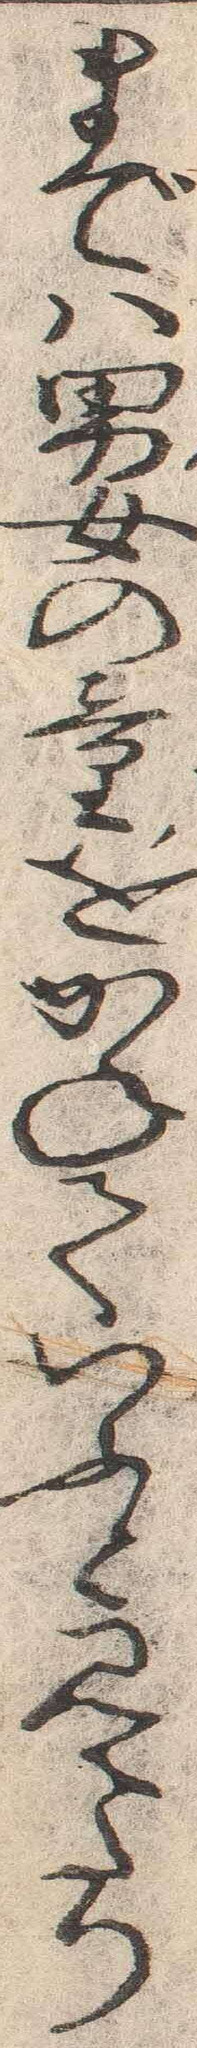までは男女の童をかねていふと見えたり
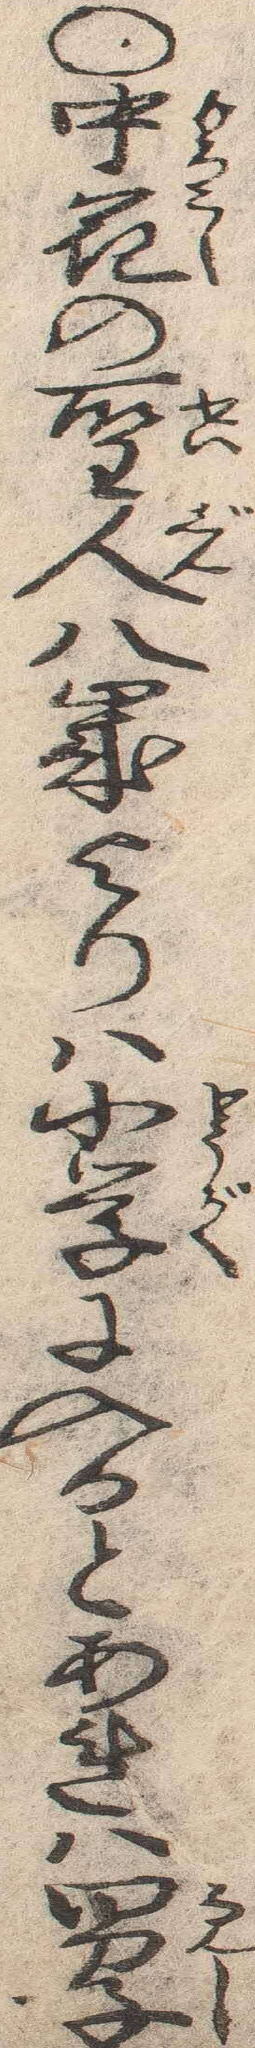○中花の聖人八歳よりは小学に入るとあれは男子

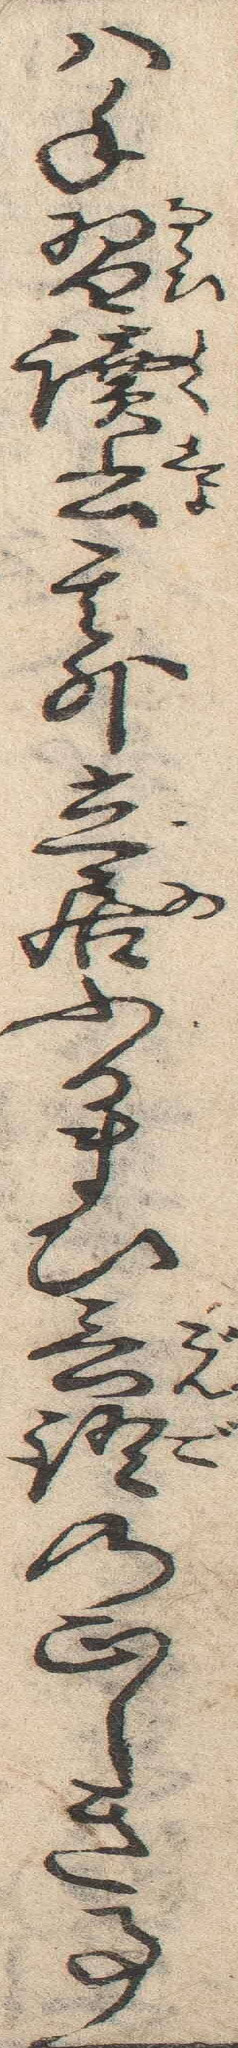は手習読書其外立居ふるまひ言語の正しき事
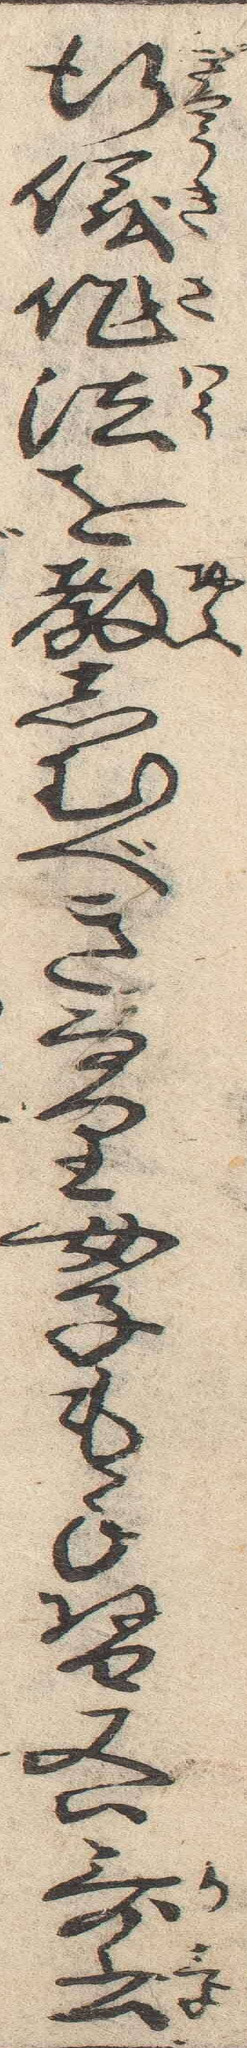行儀作法を教しむべきなり女子も手習又は哥書
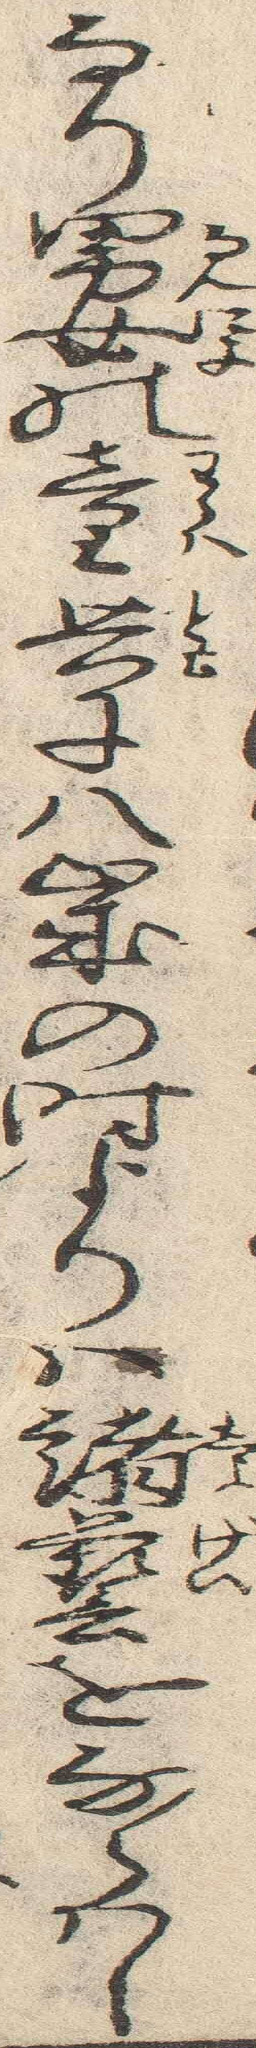なり男女の童共に八歳の時よりは諸芸をならはし
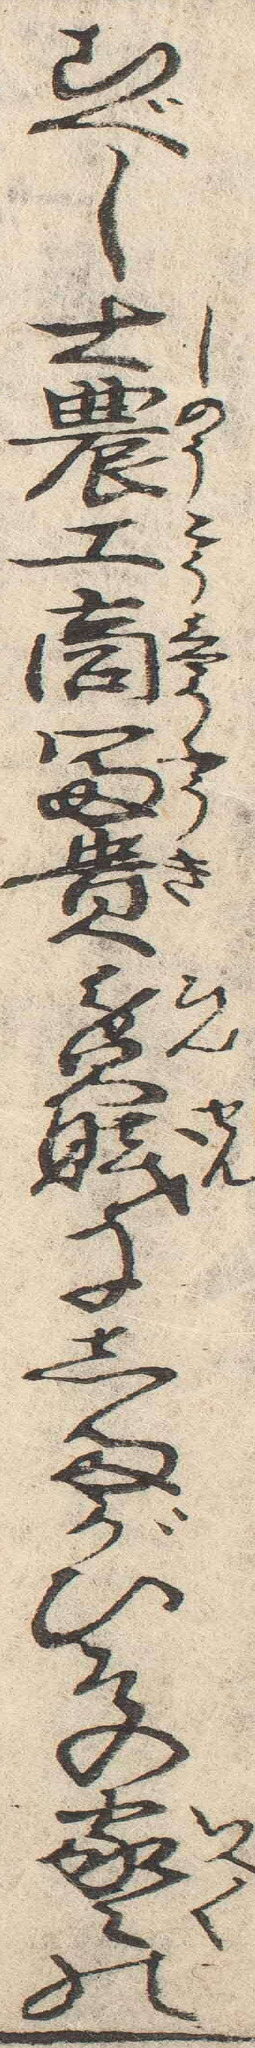むべし士農工商富貴貧賤にしたがひその家々の
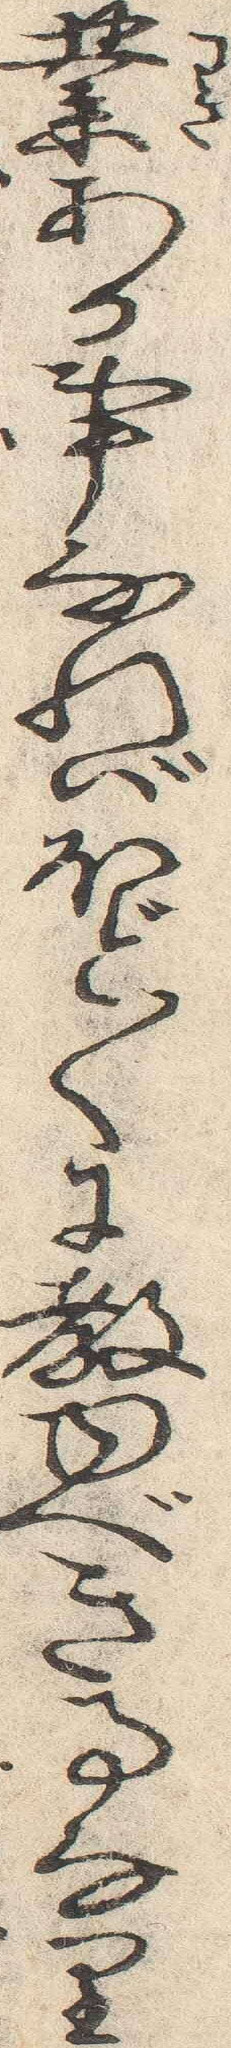業ある事なればほど〳〵に教ゆべき事なり
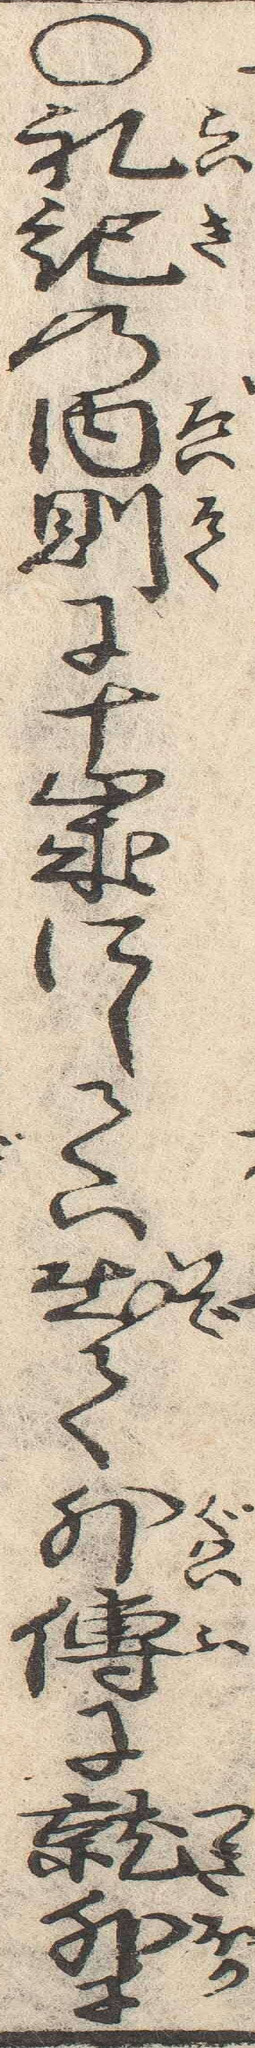○礼記の内則に十四歳にしては出て外傅に就外に
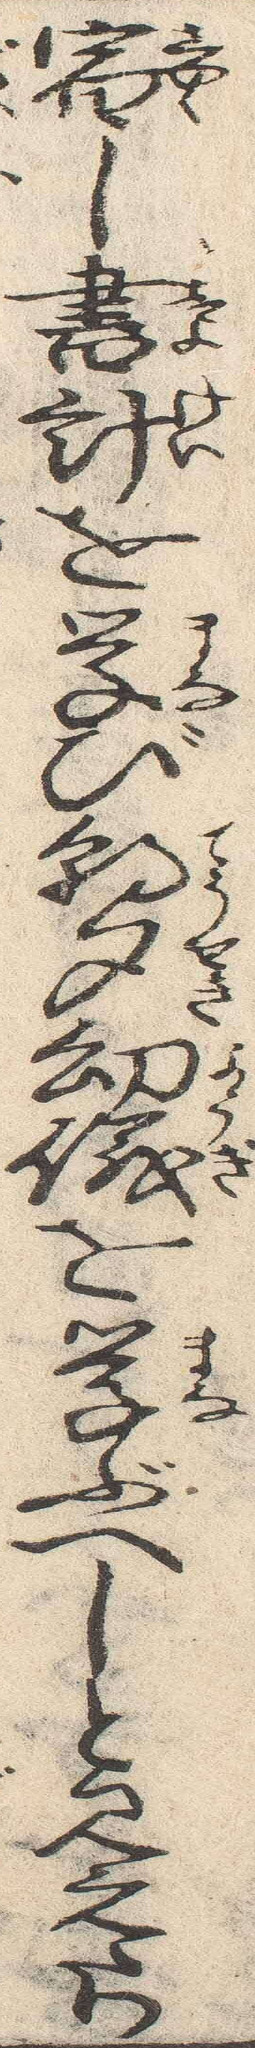宿し書計を学び朝夕幼儀を学ぶへしと見えたり
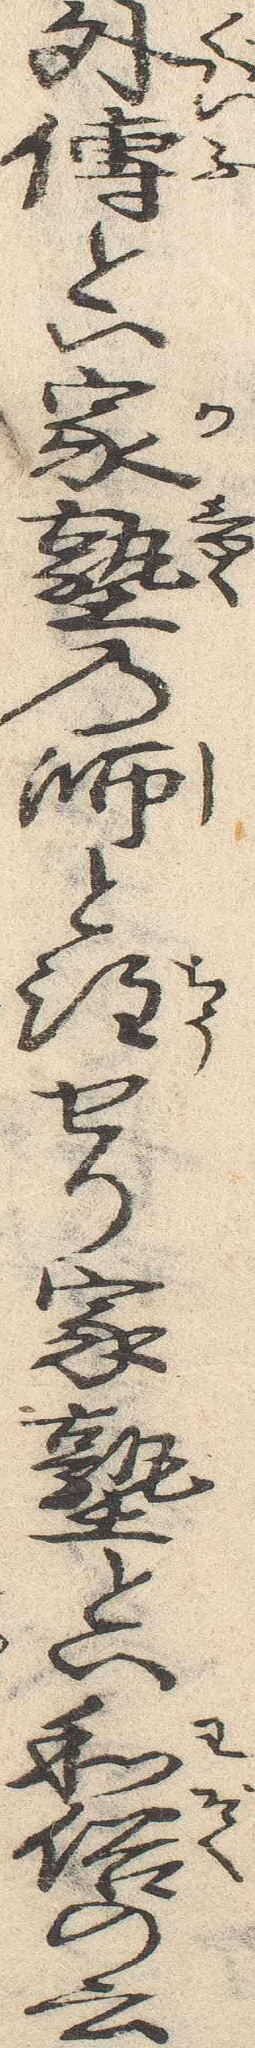外傅とは家塾の師と注せり家塾とは和俗の云
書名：小児必用養育草
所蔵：東京学芸大学附属図書館 国文学研究資料館
